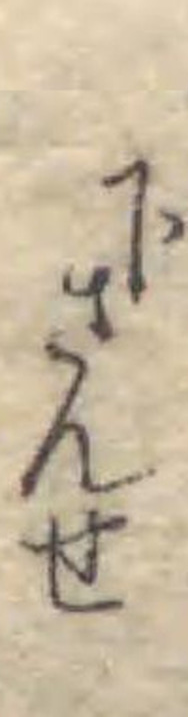下さんせ
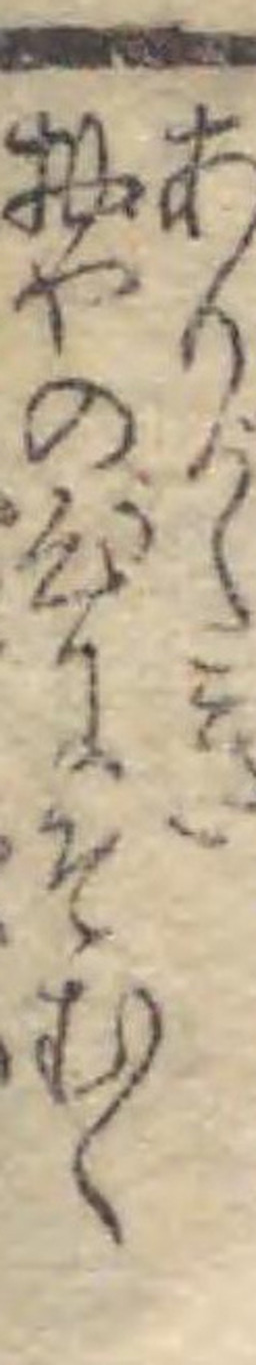おやの心にそむく
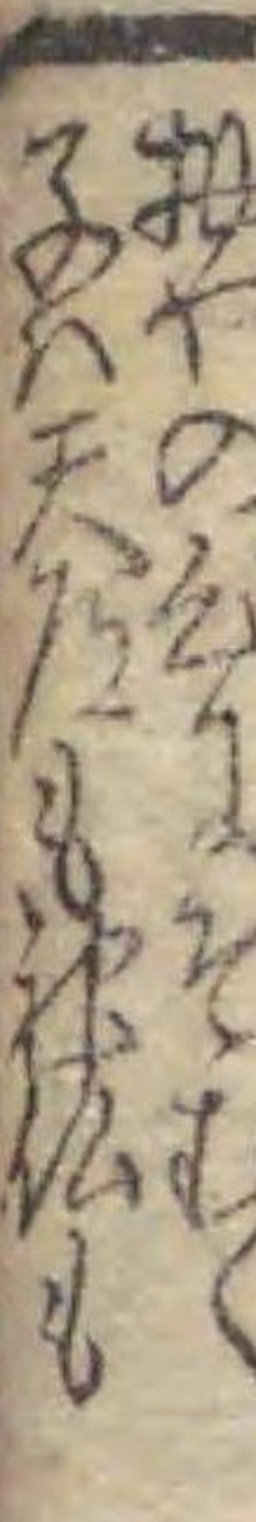子は天道も神仏も
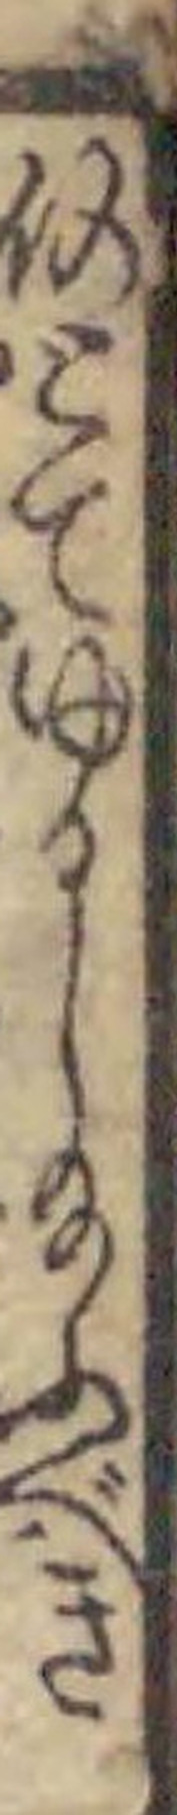何とてゆるしたまふべき
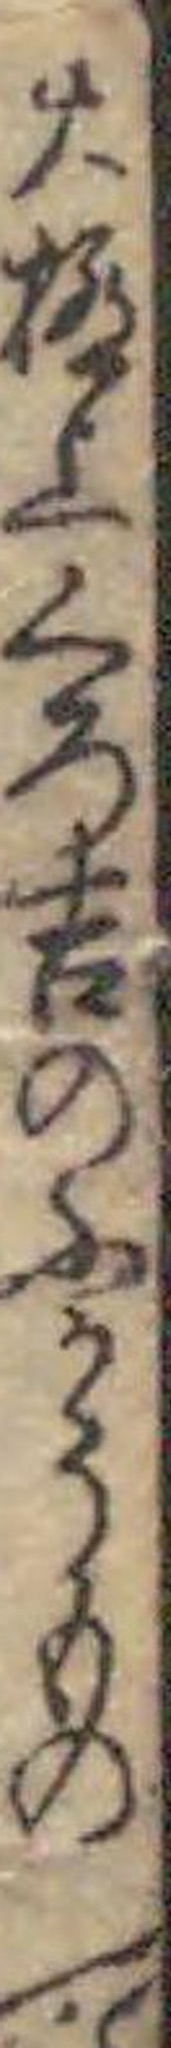大極上くろ吉のふかうもの
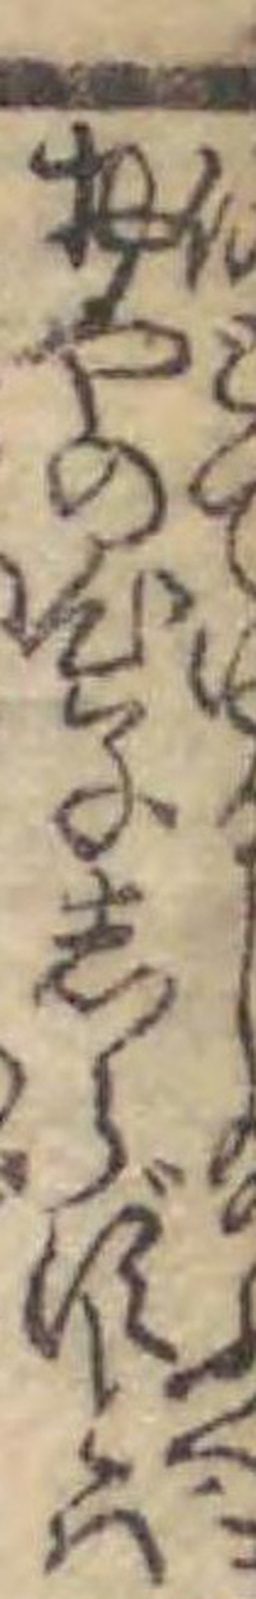おやの心子しらずとは
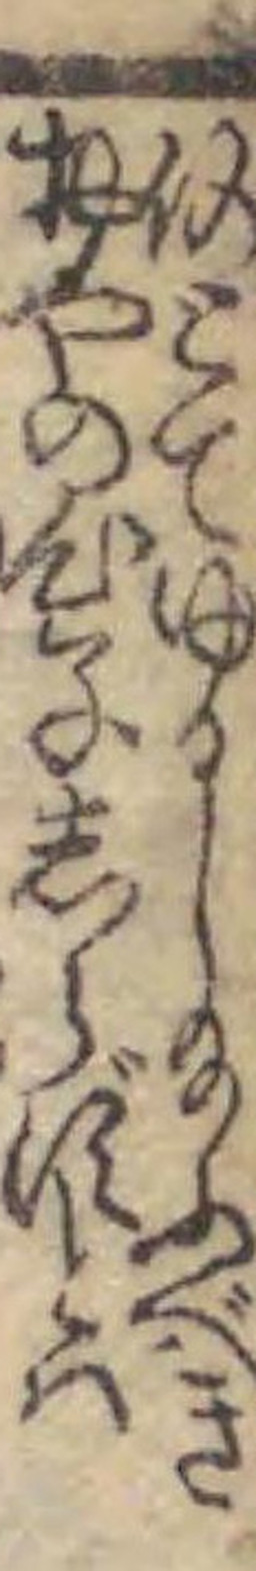おやの心子しらずとは
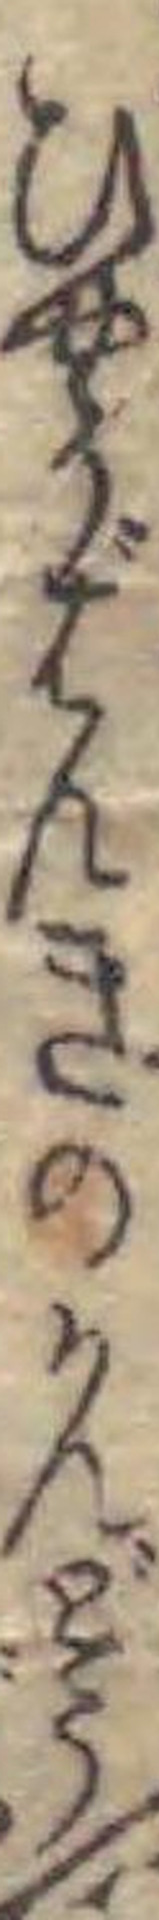ひやうばんきのかんどう
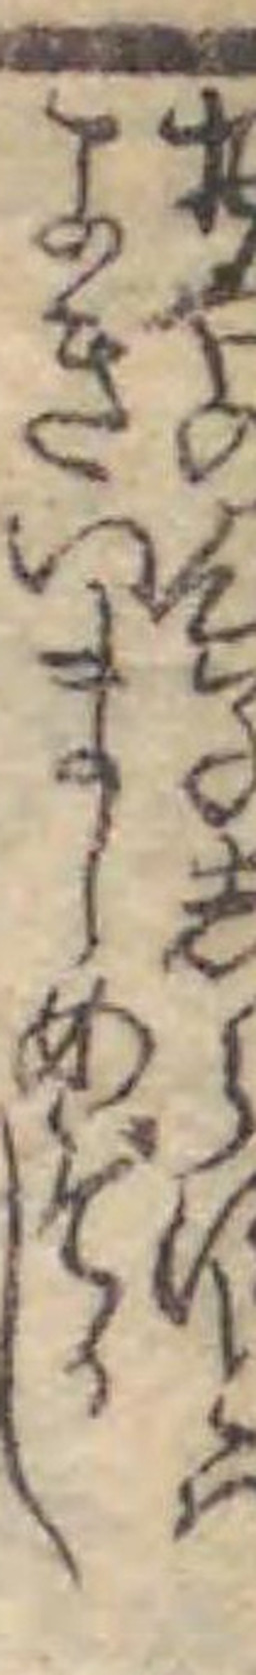よきいましめぞかし
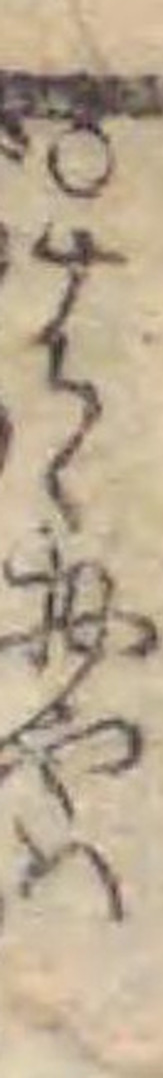○はゝおやは
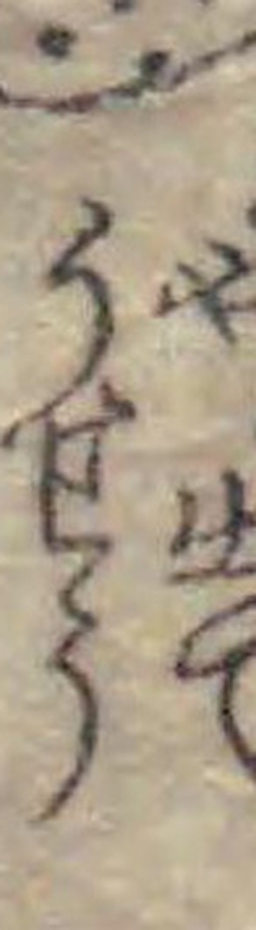うせろ
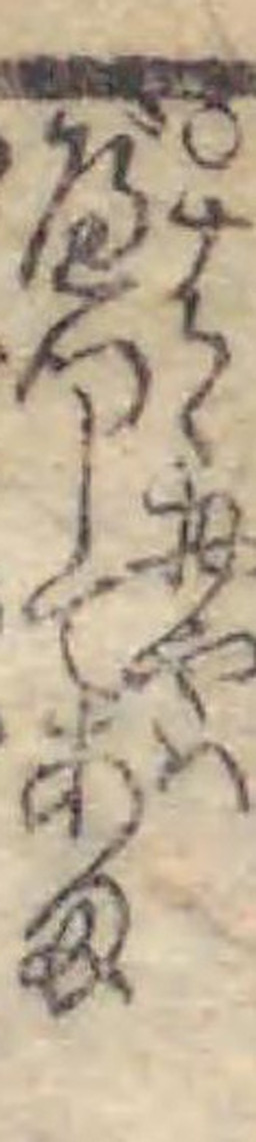べつしてあま
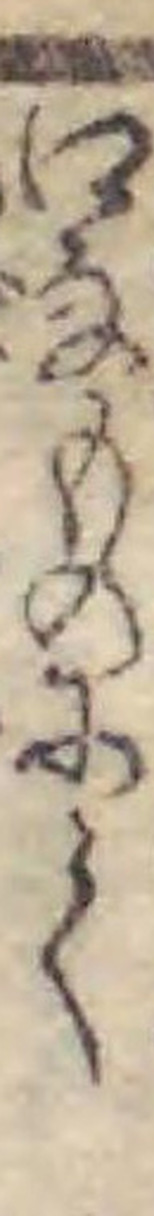口なものにて
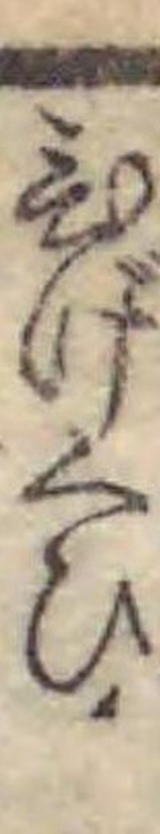ひげくひ
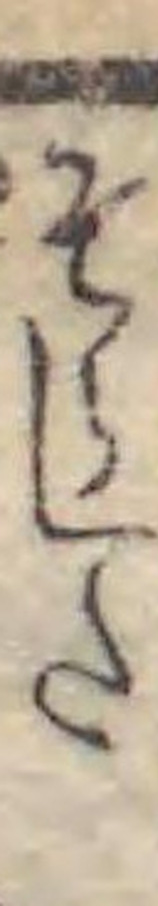そらした
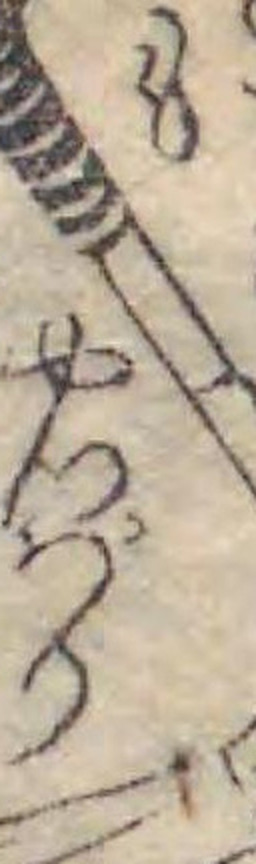やつぱり
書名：人心鏡写絵 : 3巻
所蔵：国立国会図書館 National Diet Library, JAPAN
